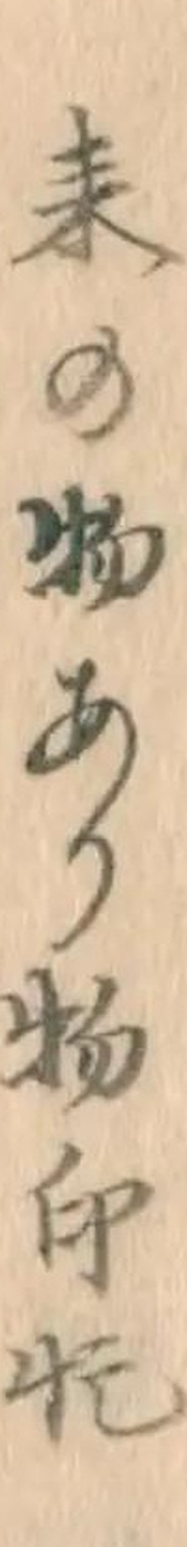来の物あり物印
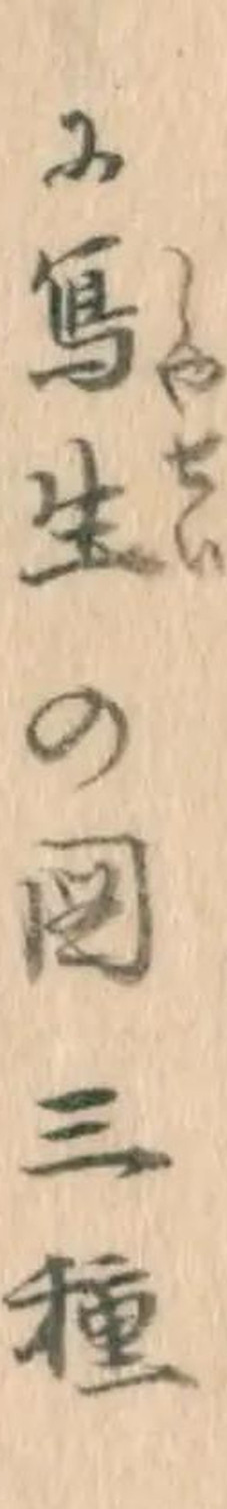に写生の図三種
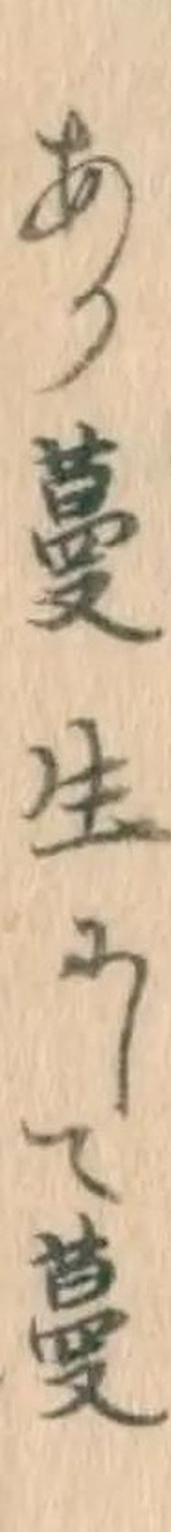あり蔓生にして蔓
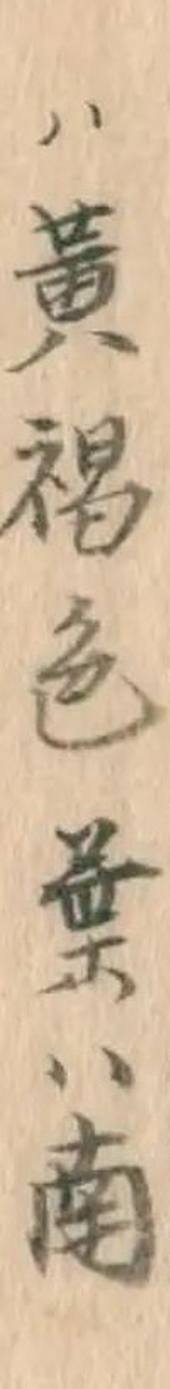は黄褐色葉は南
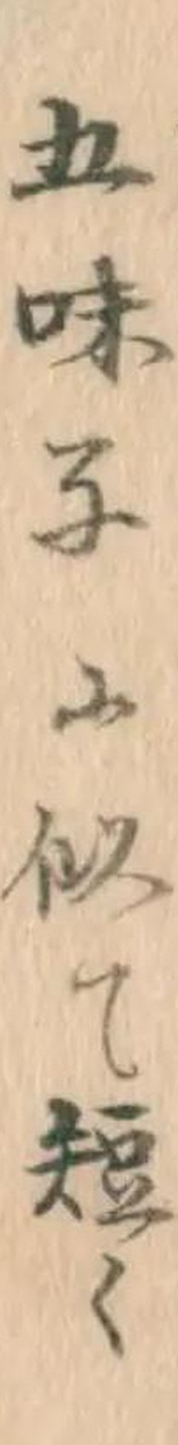五味子に似て短く
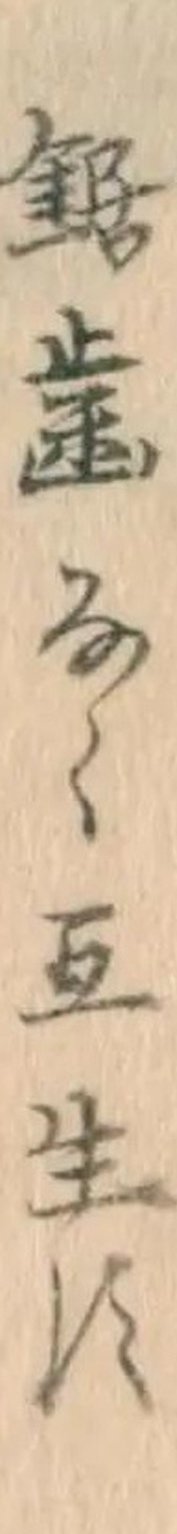鋸歯なく互生す
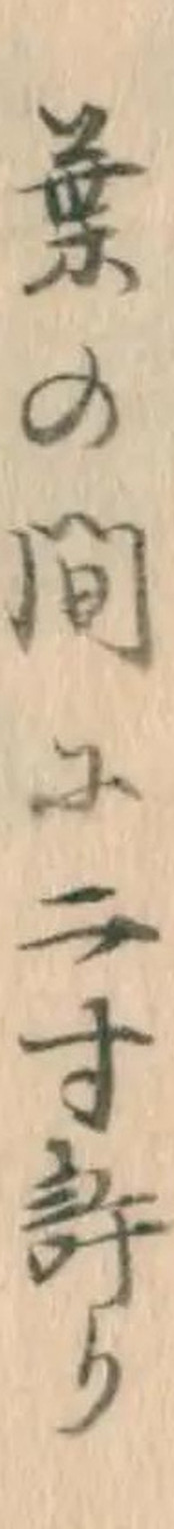葉の間に二寸計り
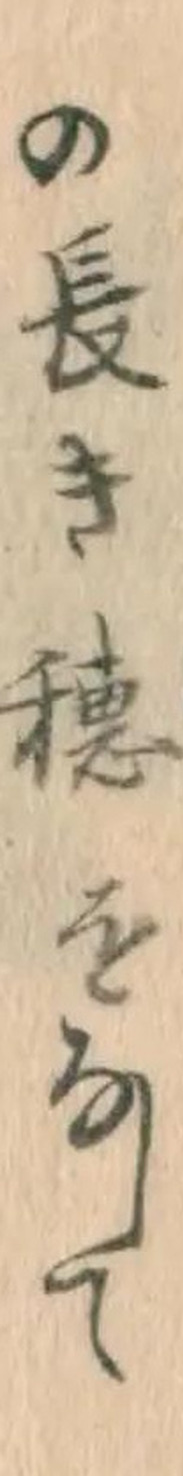の長き穂をなして
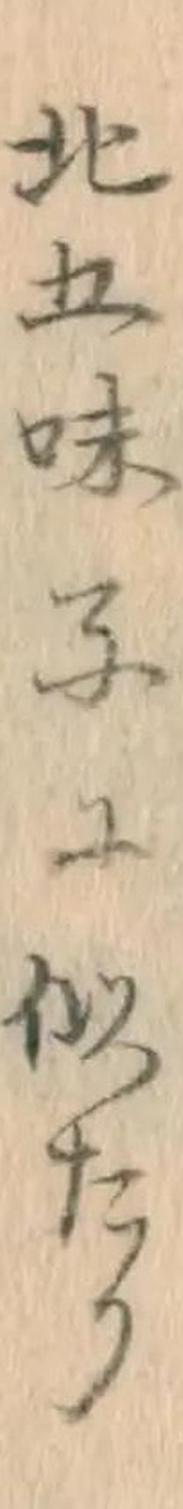北五味子に似たり
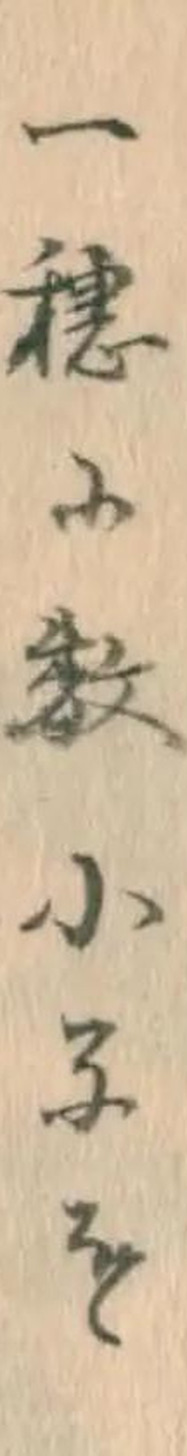一穂に数少子を
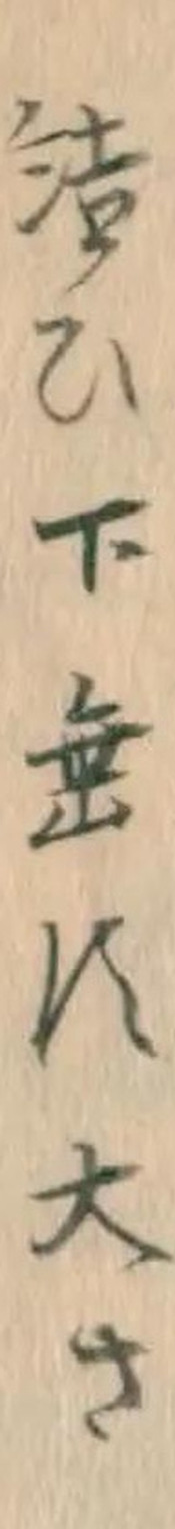結ひ下垂す大さ
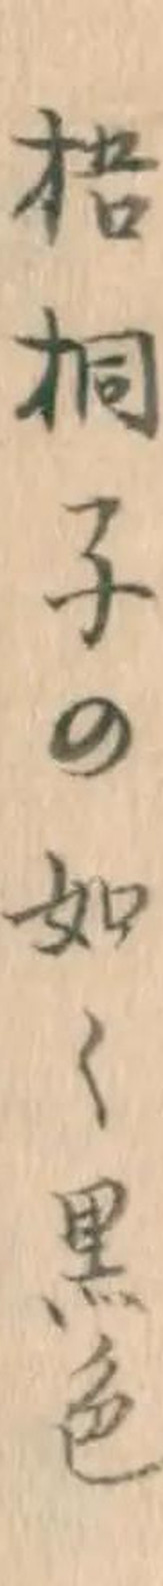梧桐子の如く黒色
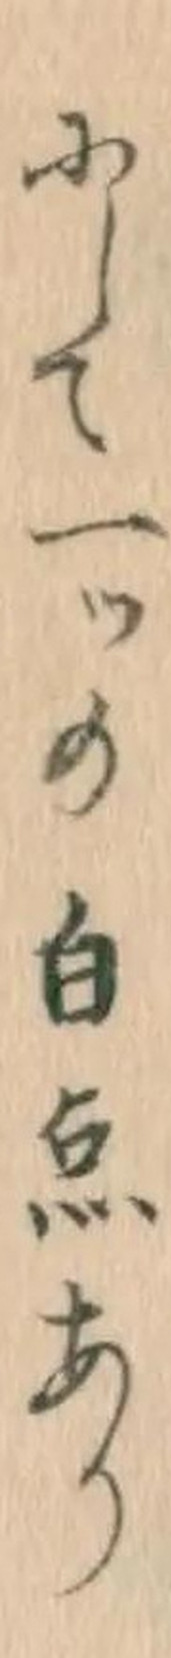にして一ッの白点あり
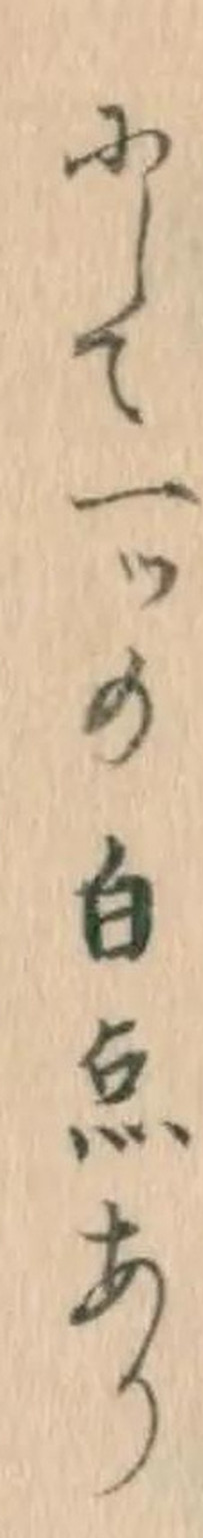にして一ッの白点あり
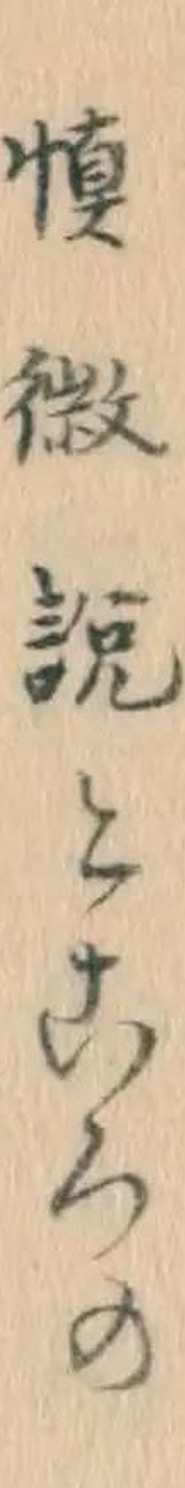慎徴説ところの
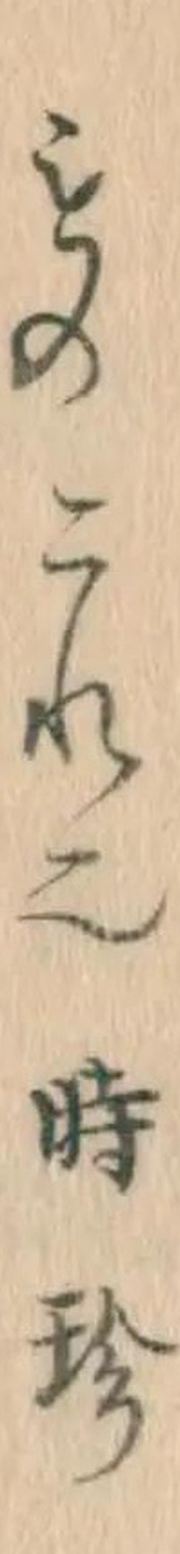ものこれ也時珍
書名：本草図譜. 巻70-72
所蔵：国立国会図書館 National Diet Library, JAPAN
